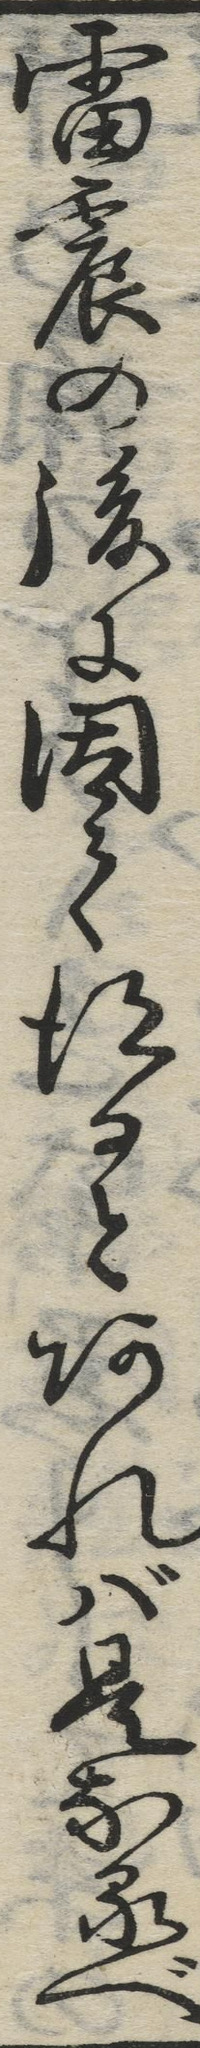雷震の後に固く得るとなれバ是なるべ
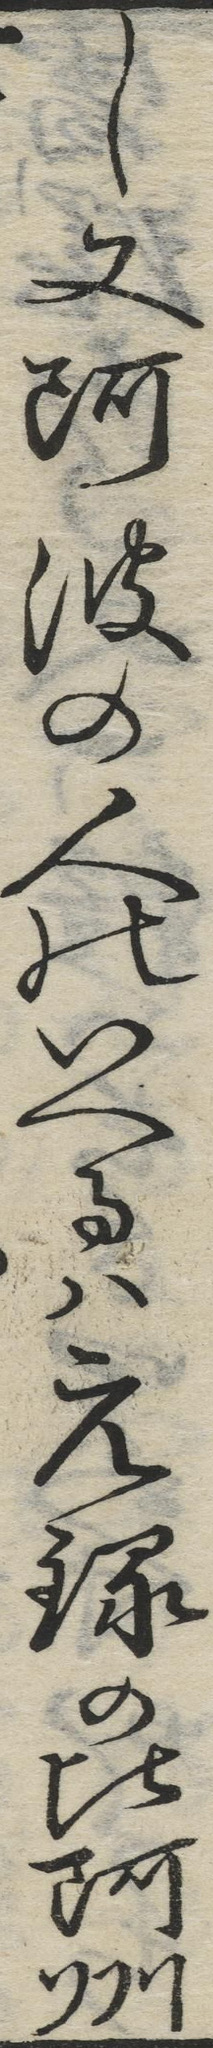し又阿波の人のいへるハ元禄の頃阿州
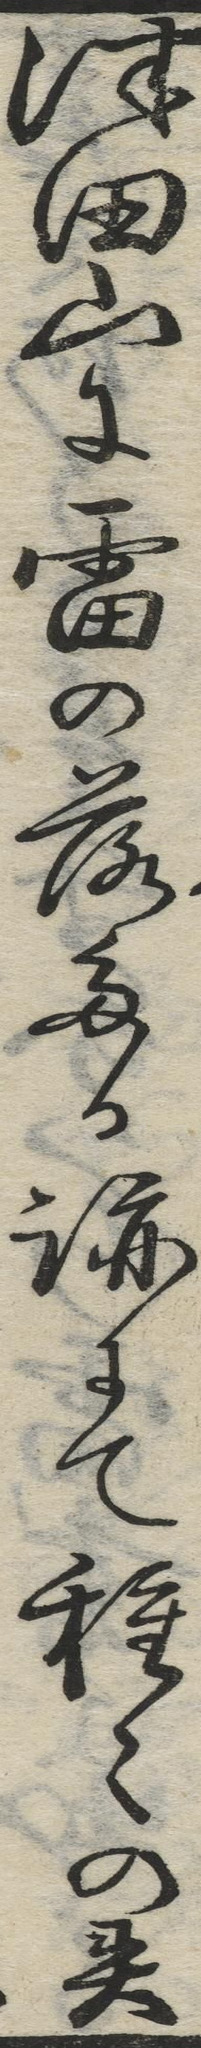津田山に雷の落たる跡にて種々の失
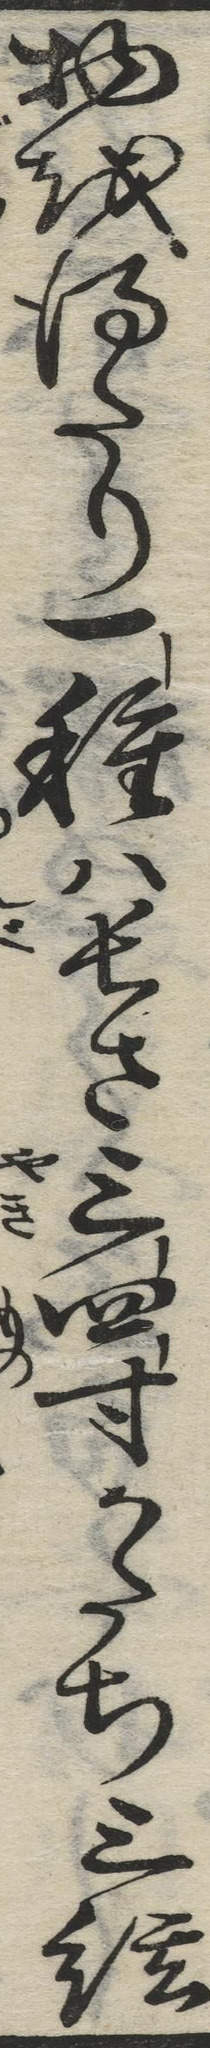物を得たり一種ハ長さ三四寸かたち三弦
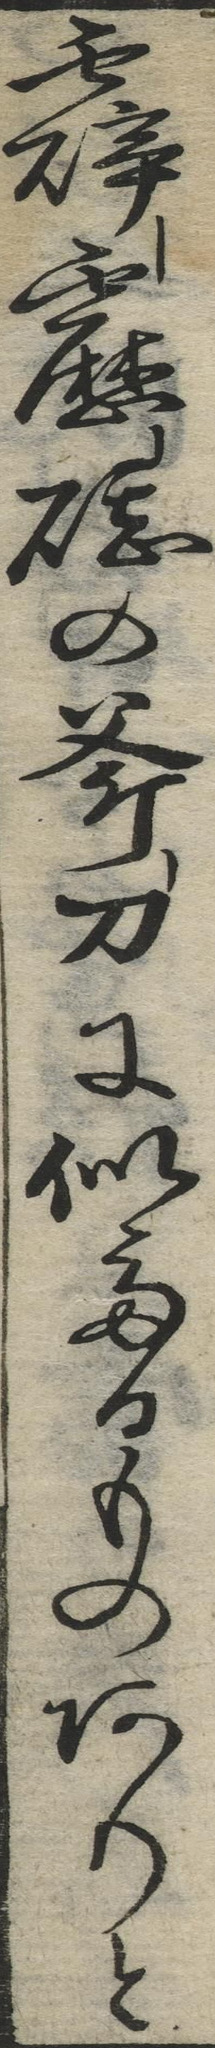霹ノ靂ノ碪の斧ノ刀にたるものありと

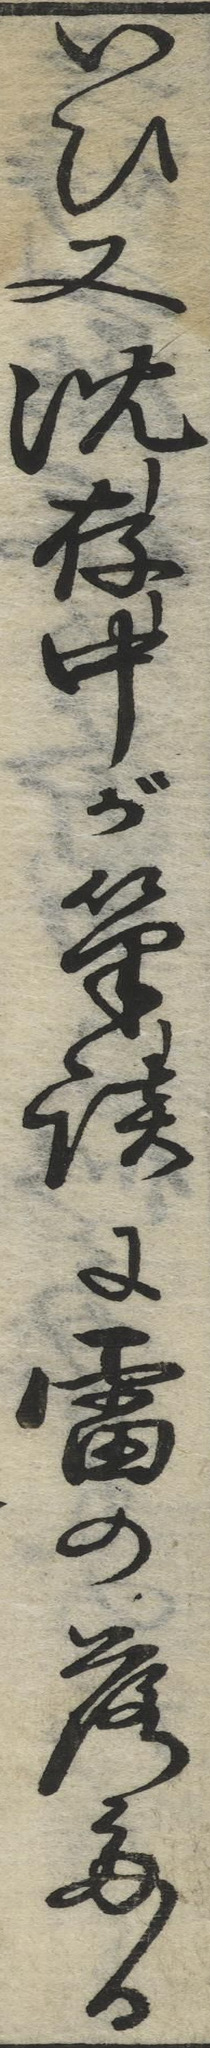いひ又沈ノ存中が筆談に雷の落たる
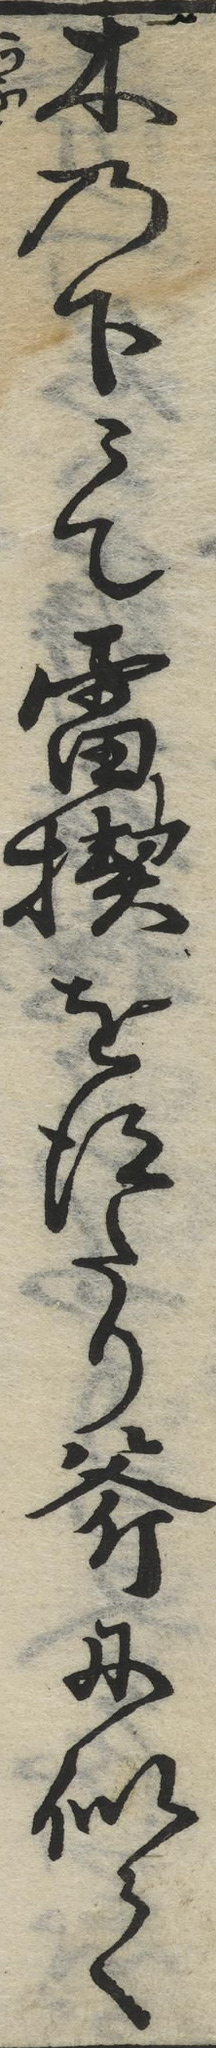木の下ニて雷楔を得たり斧に似て
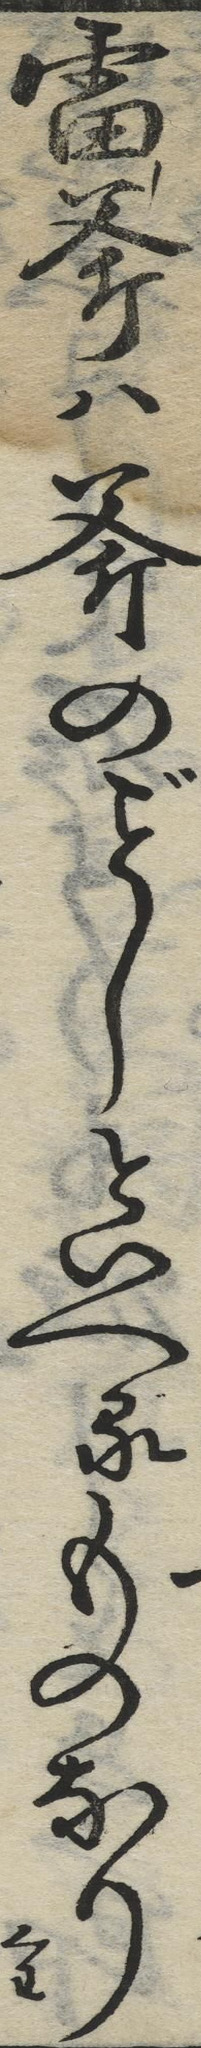雷斧ハ斧のごとしといへるものなり
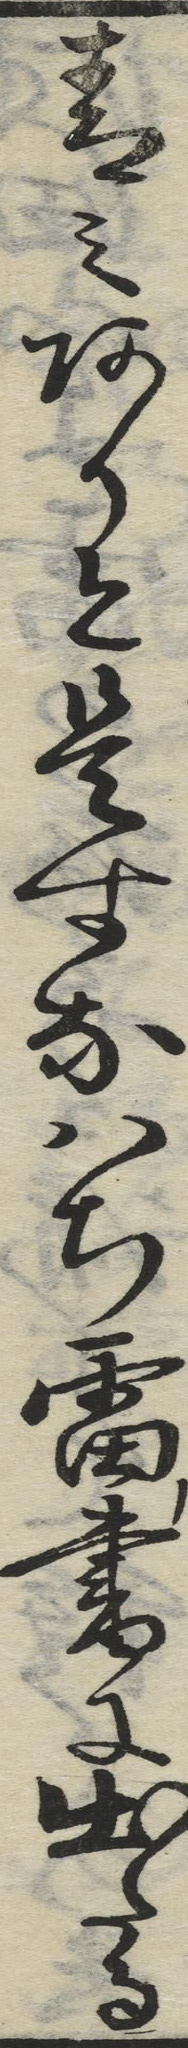青ミありと是すなハち雷ノ書に出たる
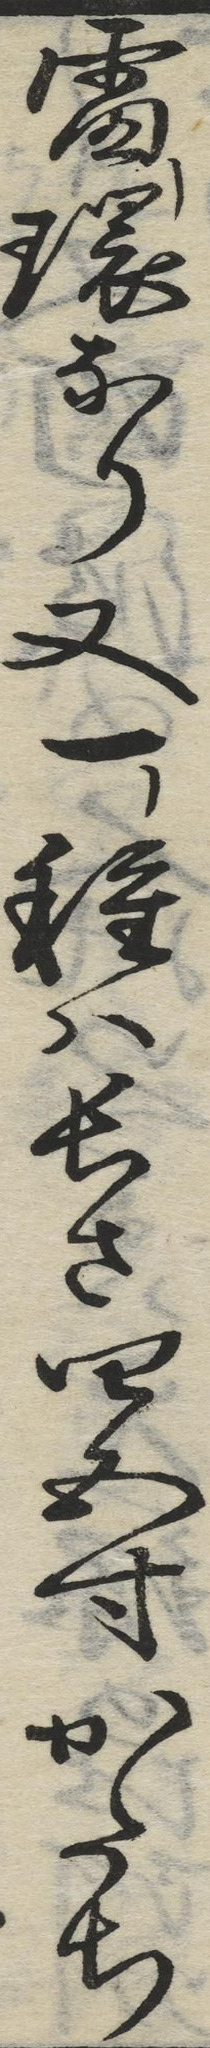雷ノ環なり又一ノ種ハ長さ四五寸かたち
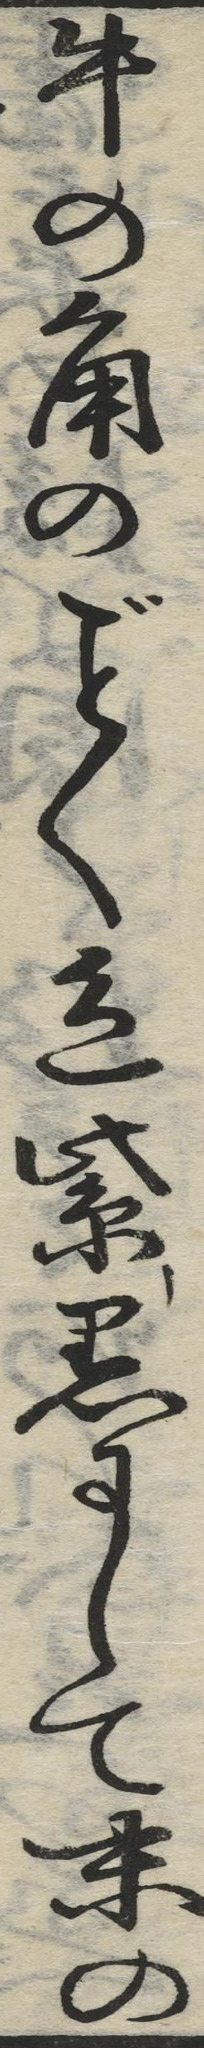牛の角のごとく色紫ノ黒にして末の
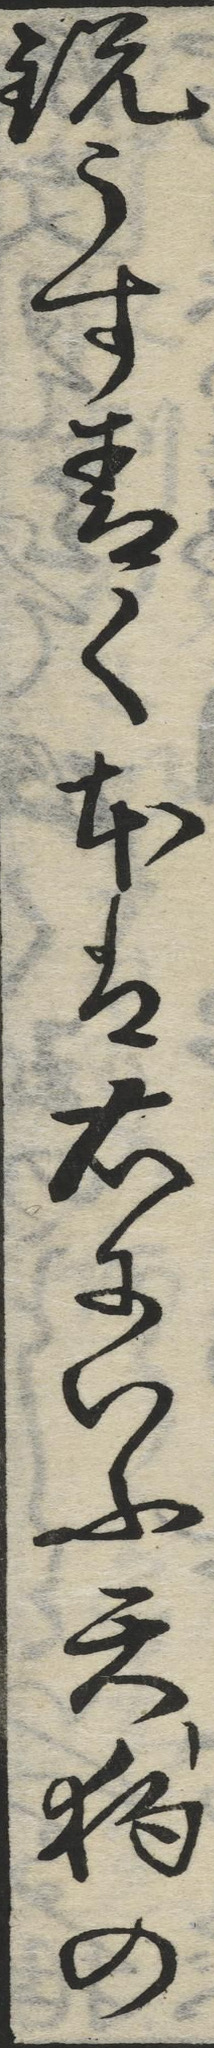鈨うす青く本は右にいふ天ノ狗の
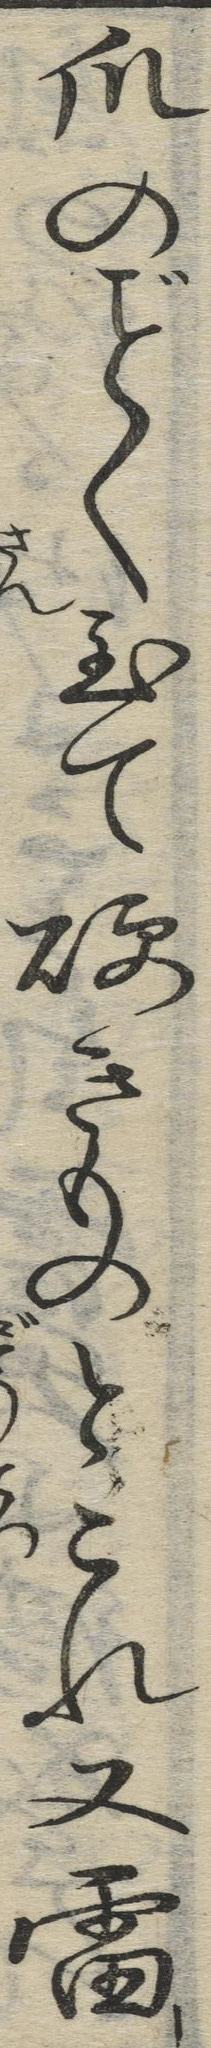爪のごとく至て硬きものとこれ又雷
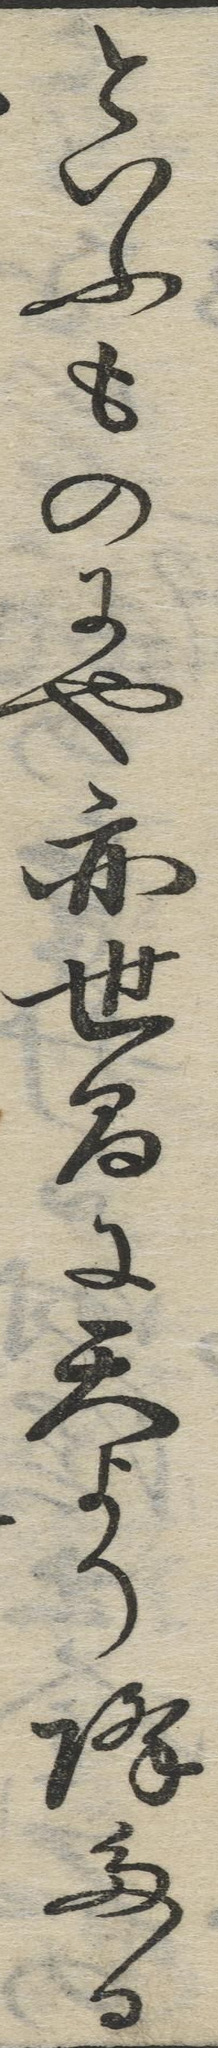といふものにや又世間に天より降たる
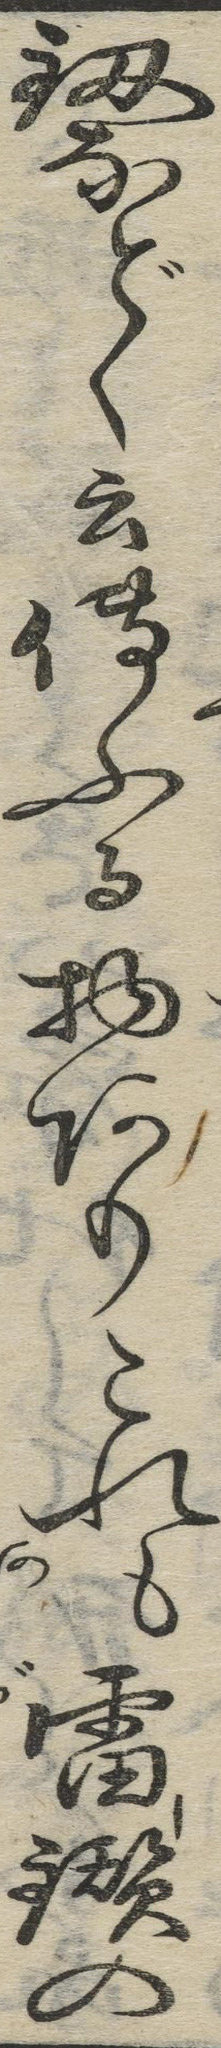釼などと云伝ふる物ありこれも雷ノ鑚の
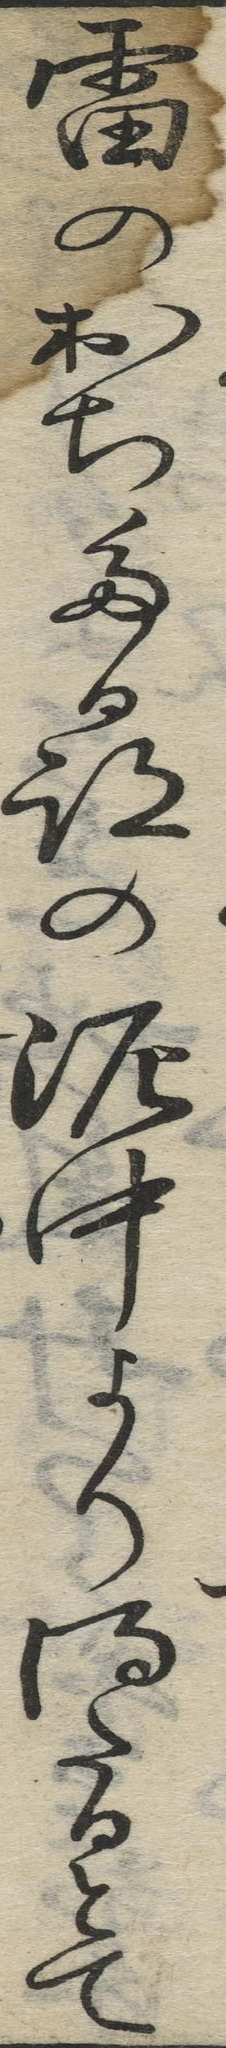雷のおちたる跡の泥中より得たるとて
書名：雷震記　完
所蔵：東京大学地震研究所図書室 Earthquake Research Institute Library, The University of Tokyo, JAPAN
